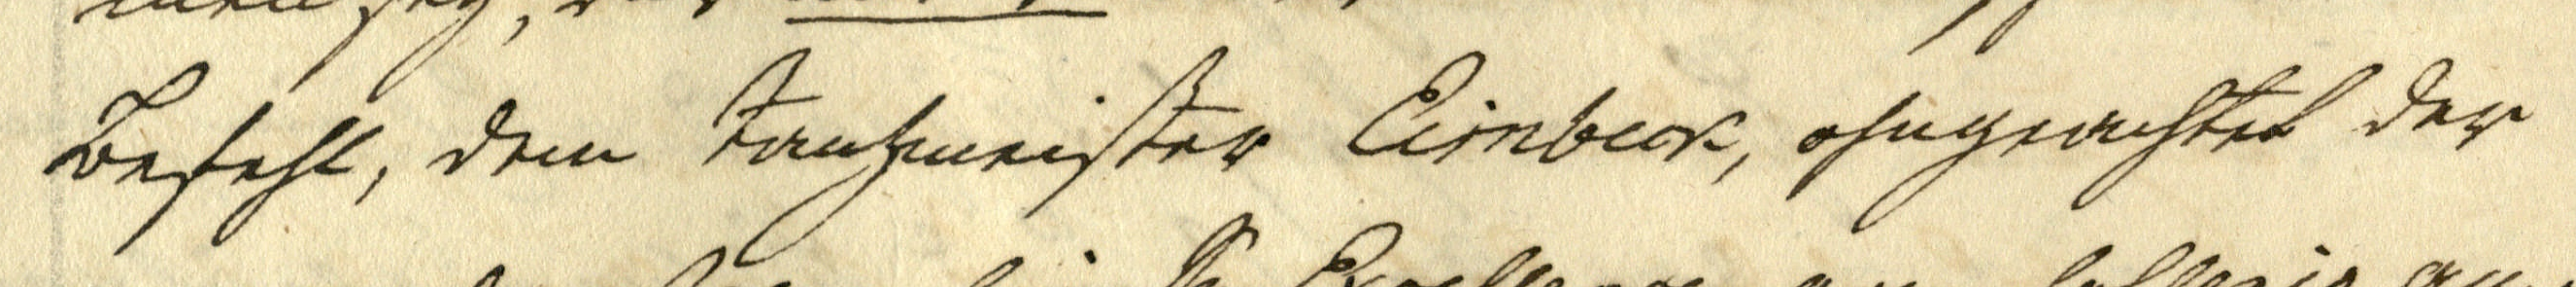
Befehl, dem Tanzmeister Eimbeck, ohngeachtet der
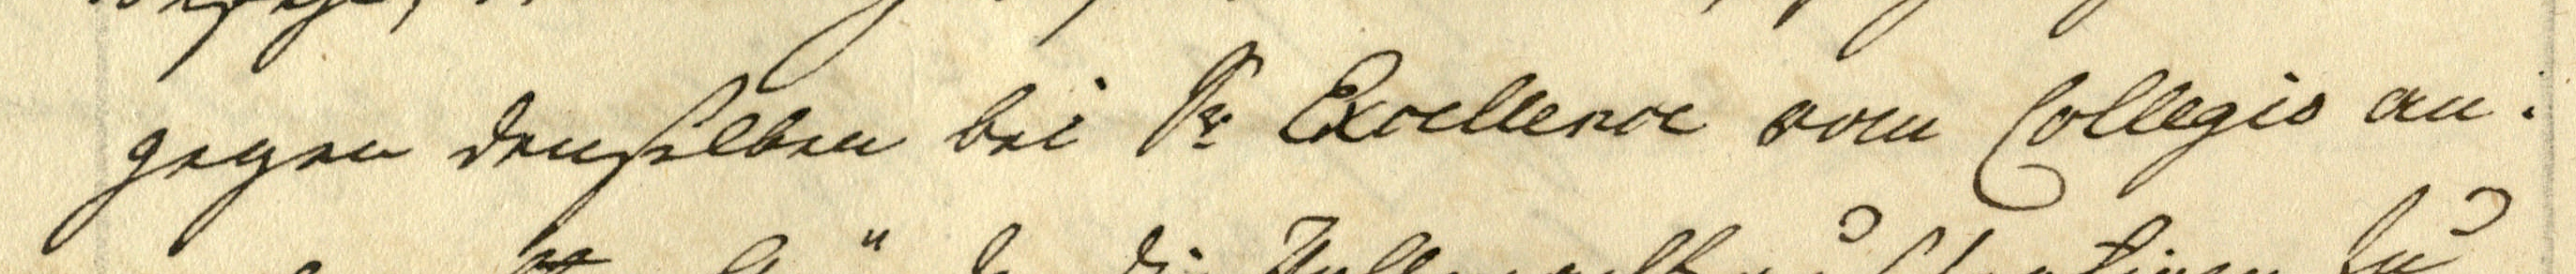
gegen denselben bei Sr Excellence vom Collegio an¬
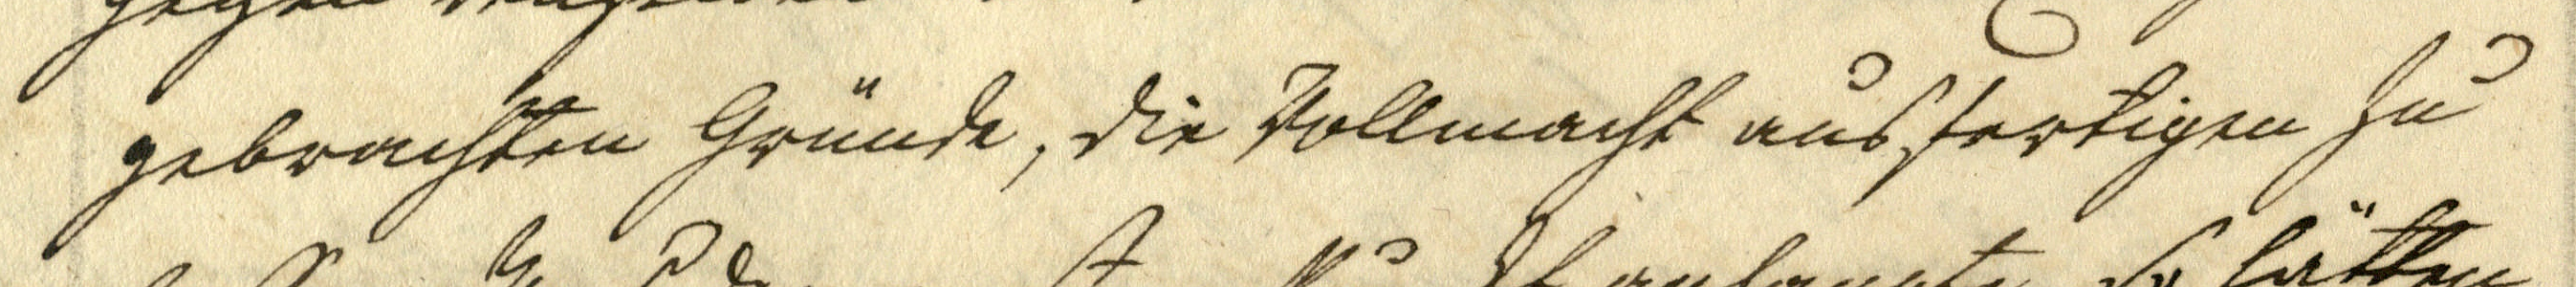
gebrachten Gründe, die Vollmacht ausfertigen zu
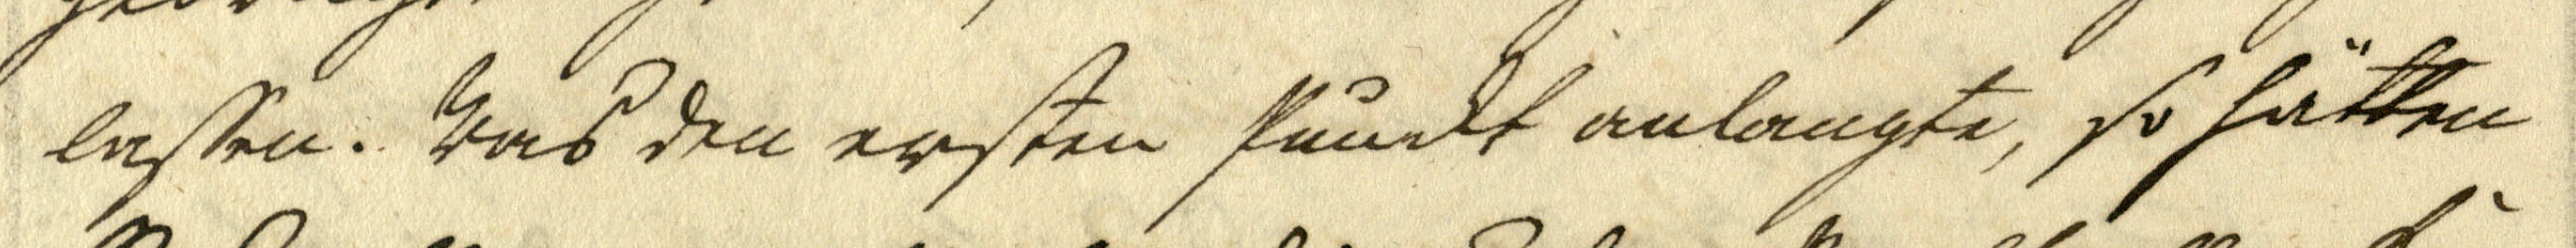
lassen. Was den ersten Punckt anlangte, so hätten
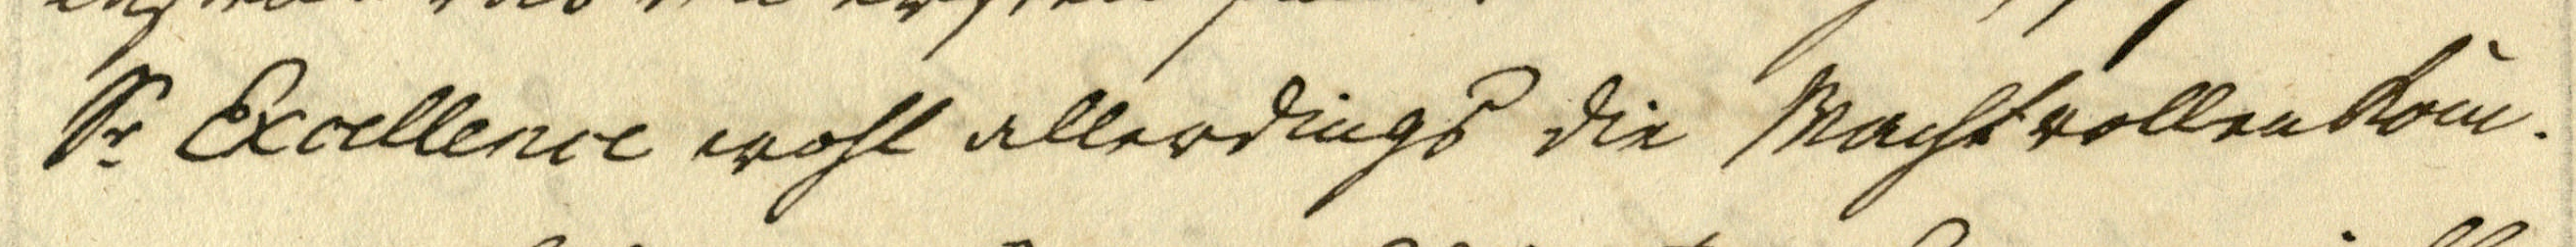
Sr Excellence wohl allerdings die Machtvollenkom¬
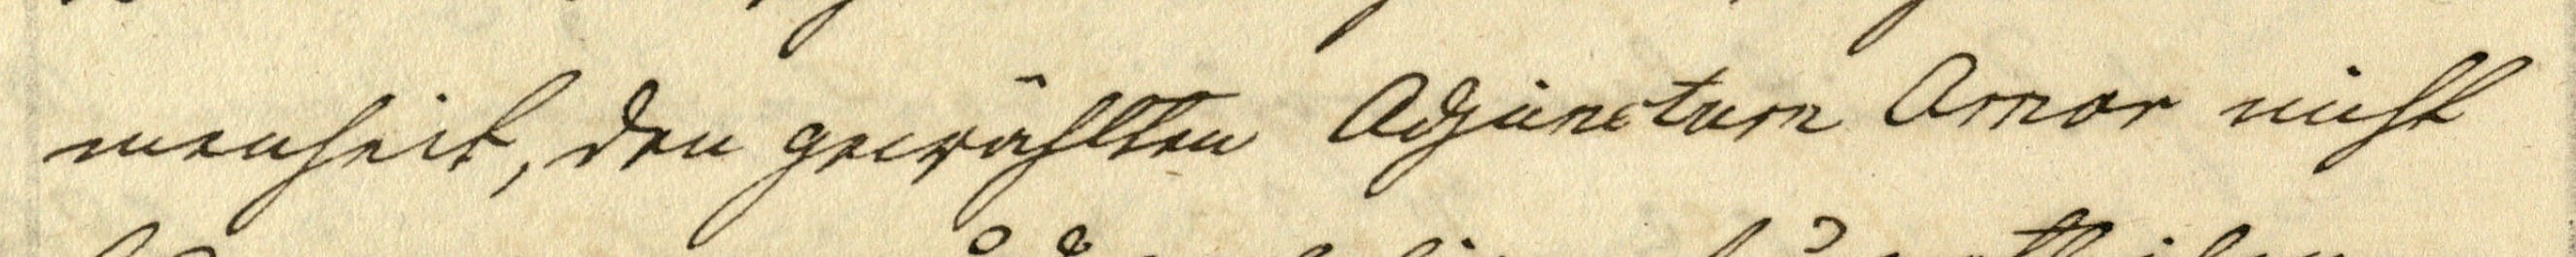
menheit, den gewählten Adjunctum Amor nicht
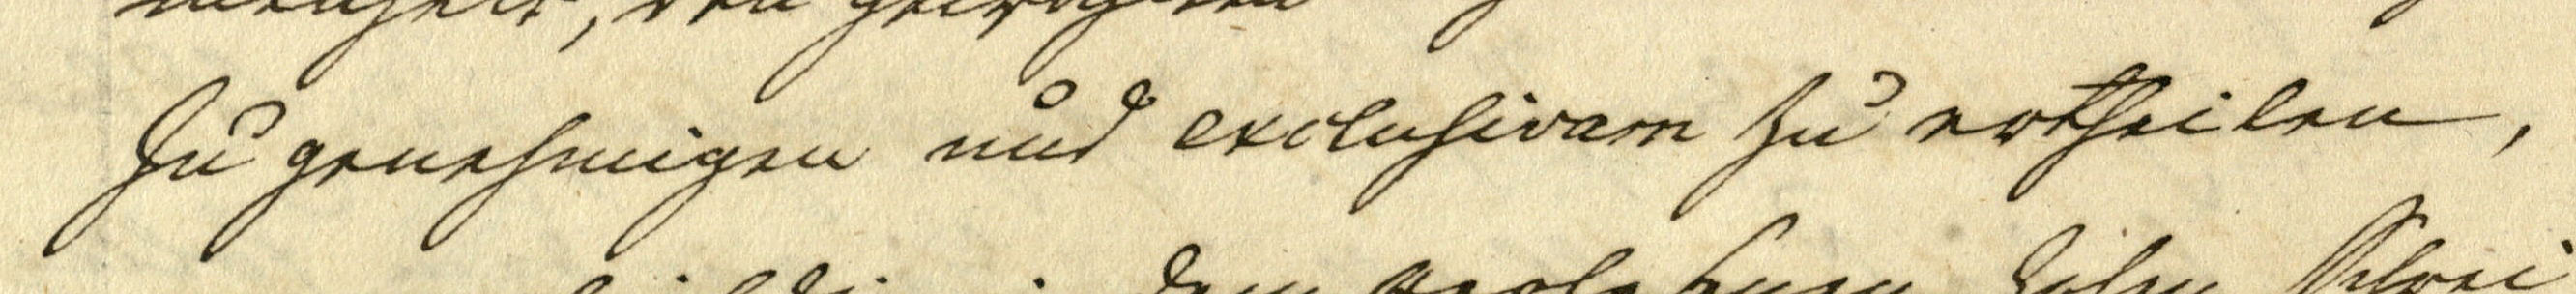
zu genehmigen und exclusivam zu ertheilen,
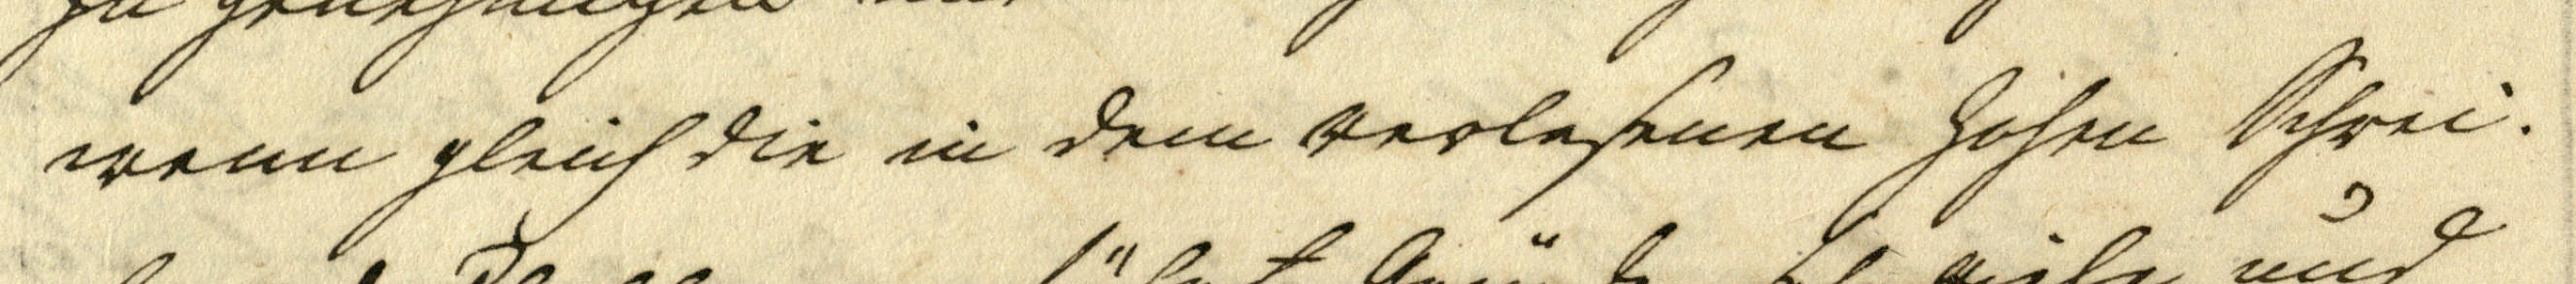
wenn gleich die in dem verlesenen Hohen Schrei¬
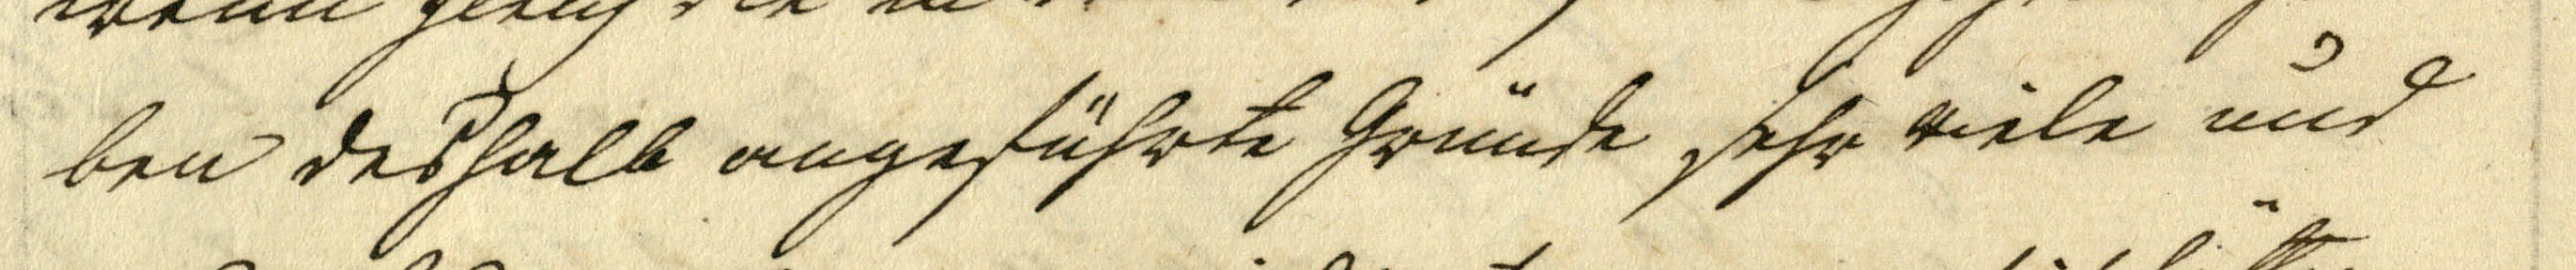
ben deshalb angeführte Gründe sehr viele und
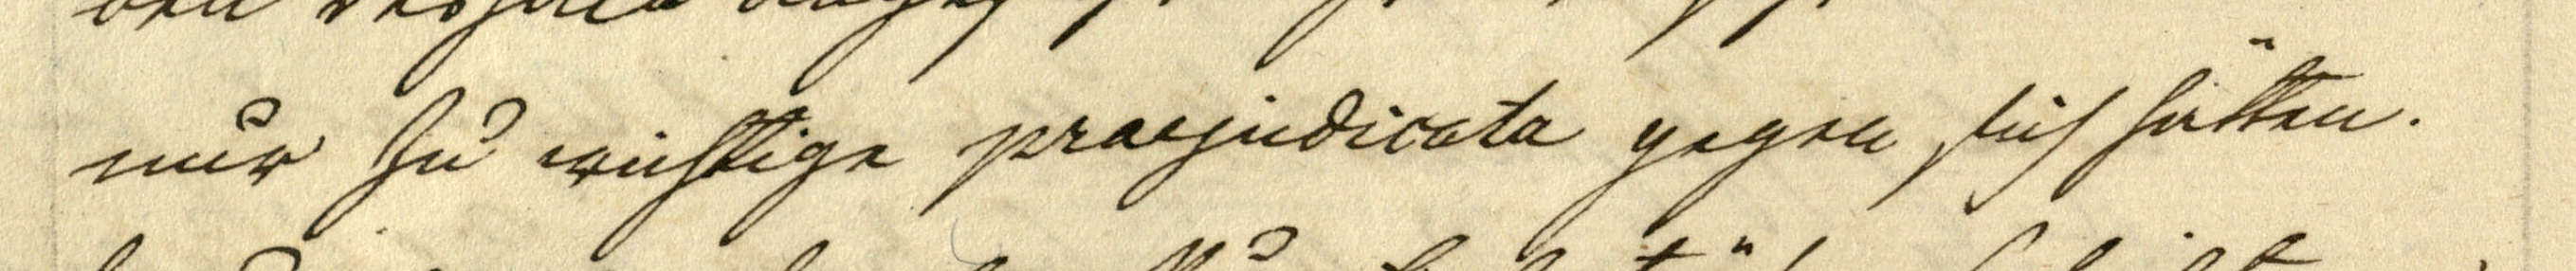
nur zu wichtige praejudicata gegen sich hätten.
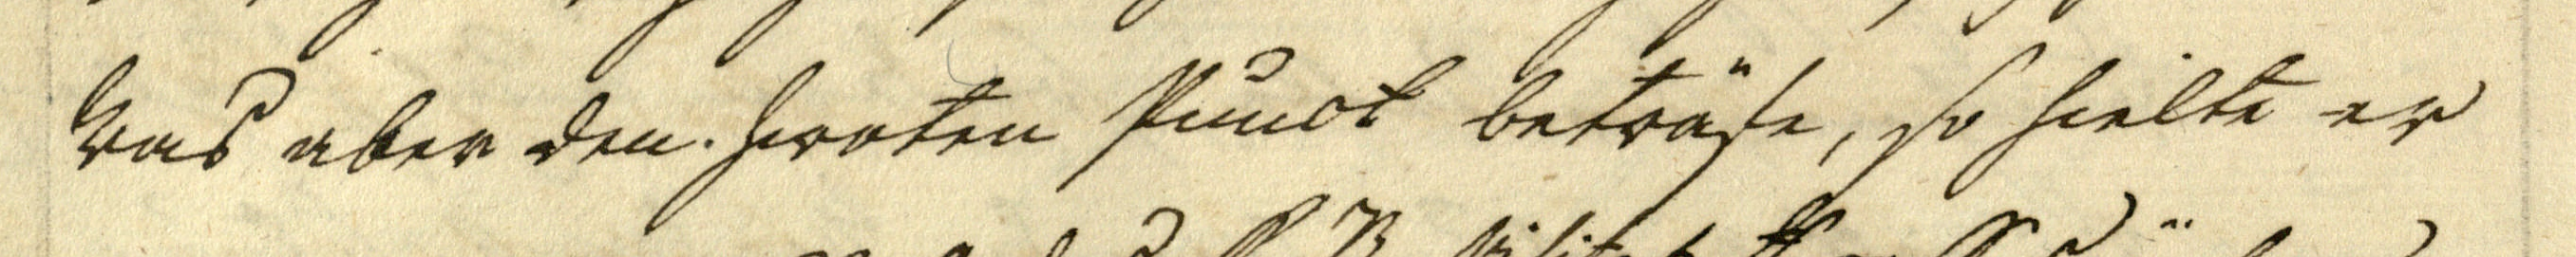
Was aber den zwoten Punct beträfe, so hielte er
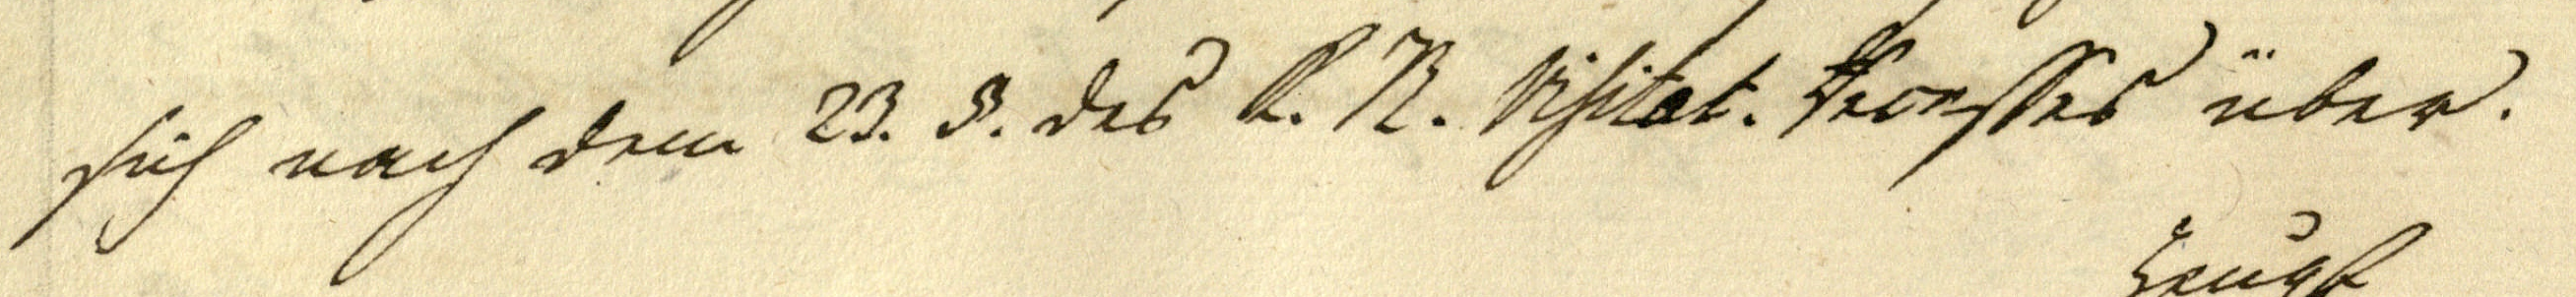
sich nach dem 23. §. des K. N. Visitat. Recesses über¬
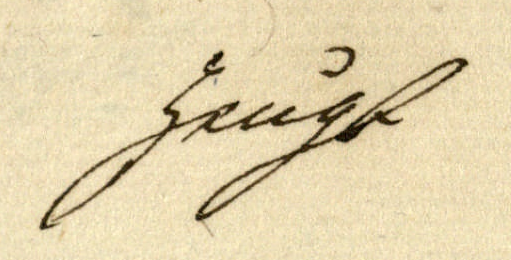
zeugt
